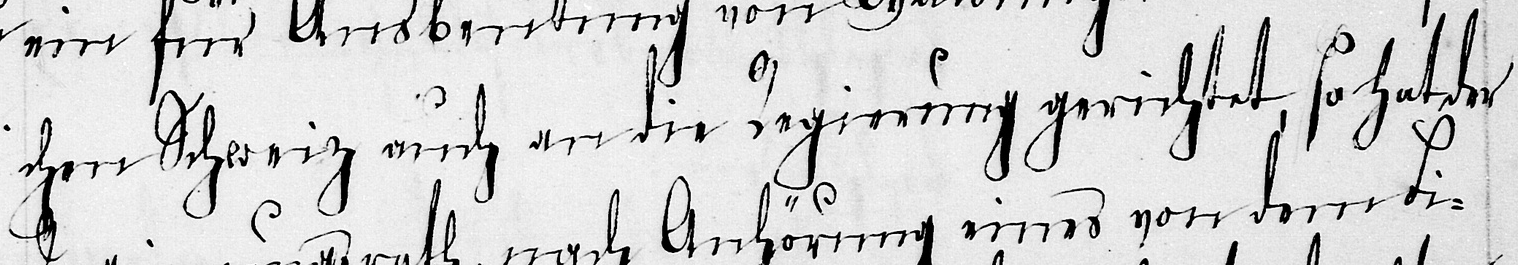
ichen Schweiz auch an die Regierung gerichtet, so hat der
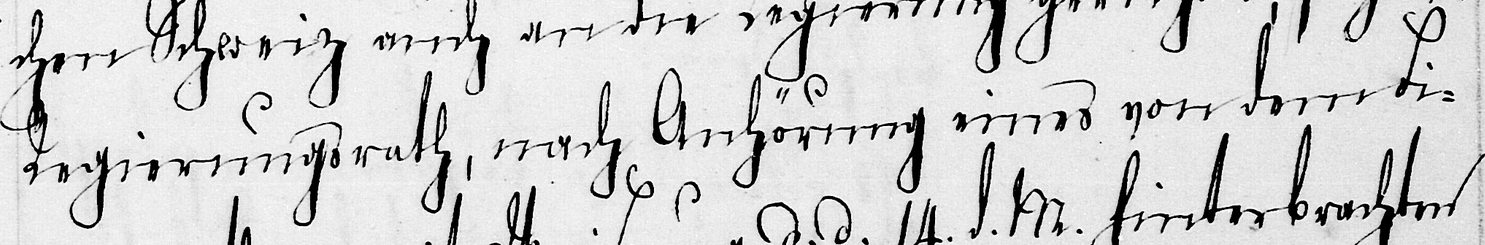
Regierungsrath, nach Anhörung eines von dem Fi¬
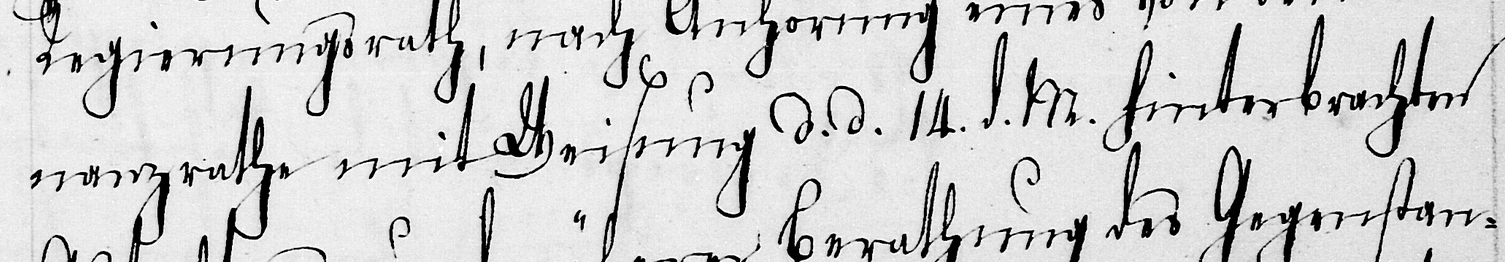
nanzrathe mit Weisung d. d. 14. d. M. hinterbrachten
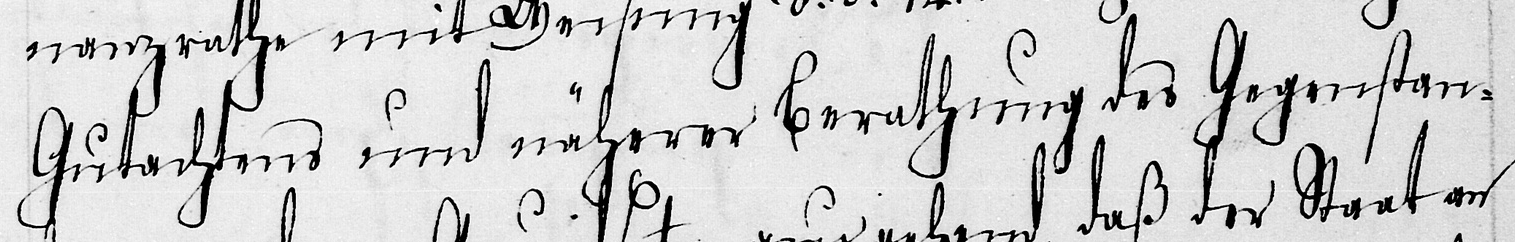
Gutachtens und näherer Berathung des Gegenstan¬
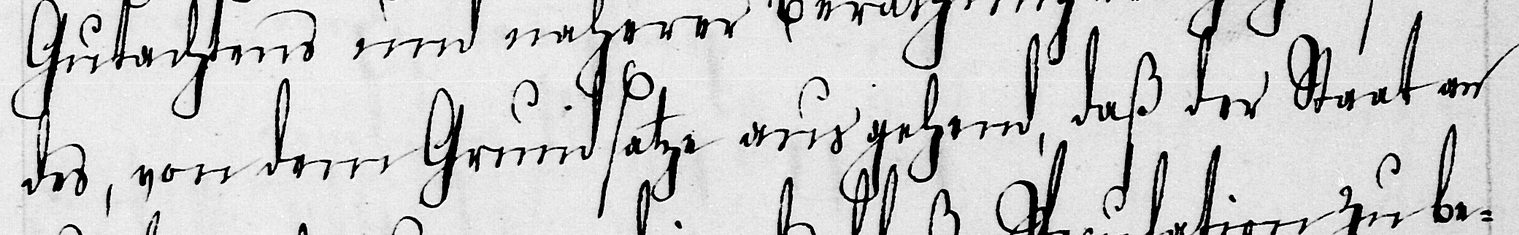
des, von dem Grundsatze ausgehend, daß der Staat an
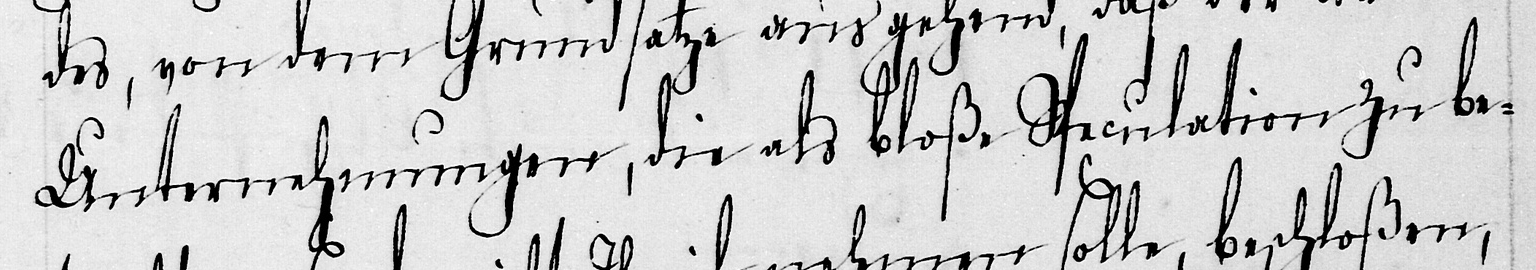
Unternehmungen, die als bloße Speculation zu be¬
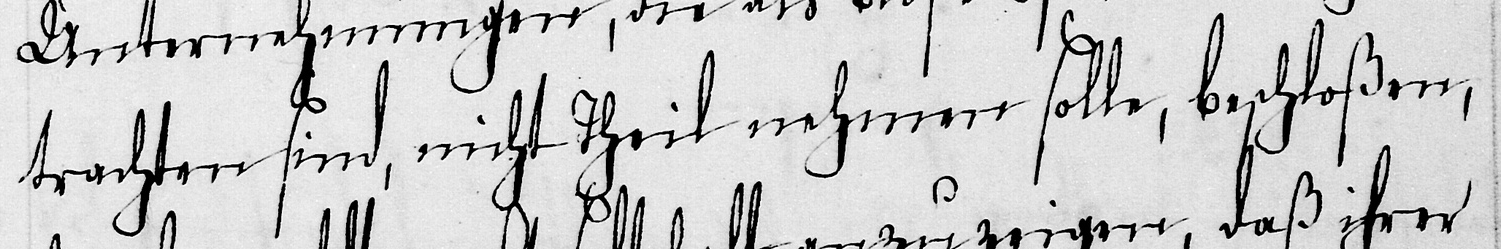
trachten sind, nicht Theil nehmen solle, beschloßen,
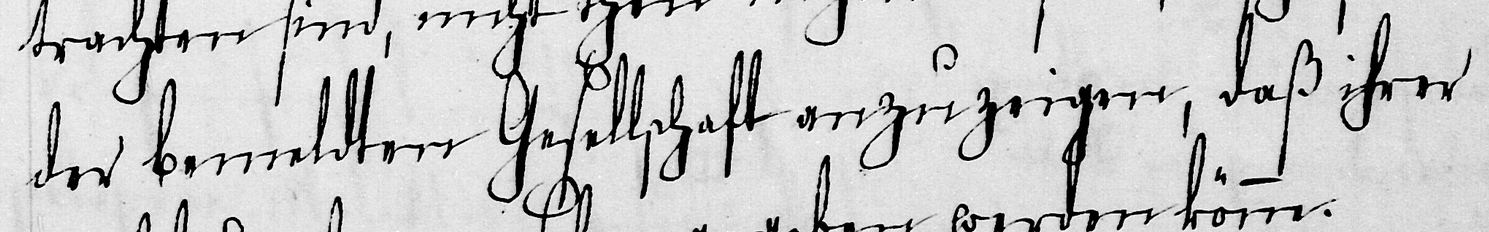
der bemeldten Gesellschaft anzuzeigen, daß ihrer
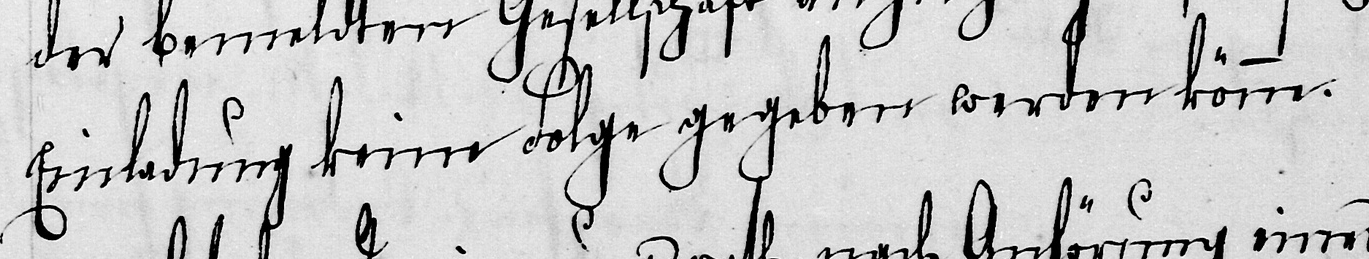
Einladung keine Folge gegeben werden könne.
